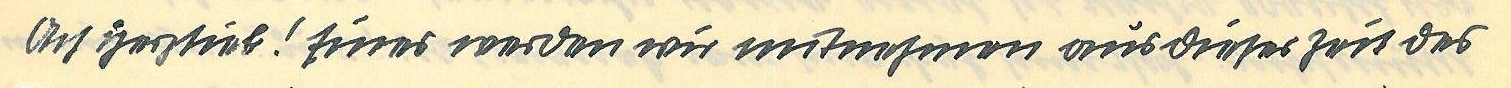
Ach Herzlieb! Eines werden wir mitnehmen aus dieser Zeit des
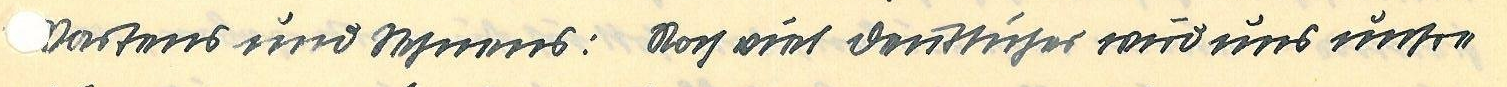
artens und Sehnens: Noch viel deutlicher wird uns unsre
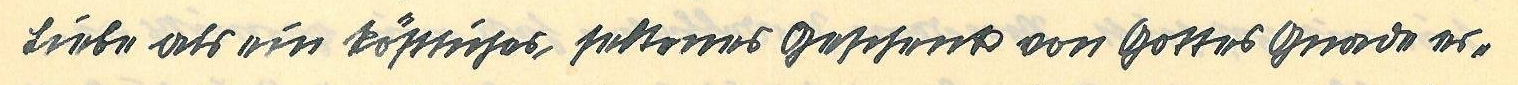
Liebe als ein köstliches, seltenes Geschenk von Gottes Gnade er¬
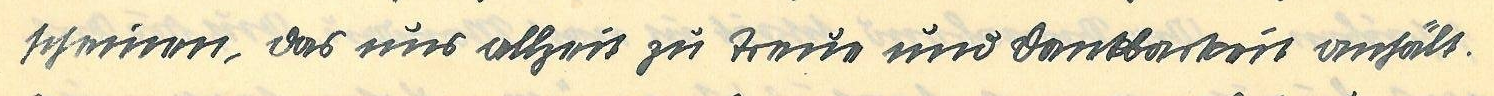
scheinen, das nur allzeit zu Treue und Dankbarkeit anhält.
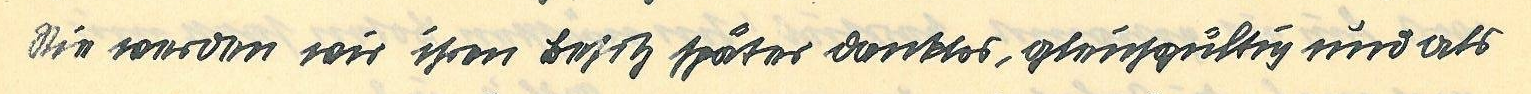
Sie werden wir ihren Besitz später danklos, gleichgültig und als
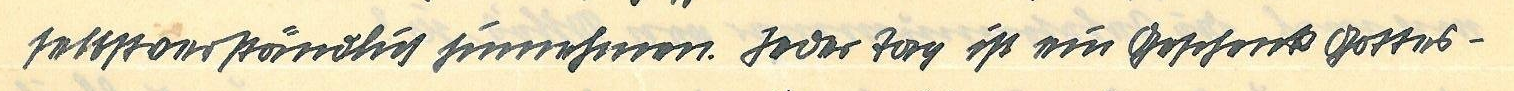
selbstverständlich hinnehmen. Jeder Tag ist ein Geschenk Gottes –
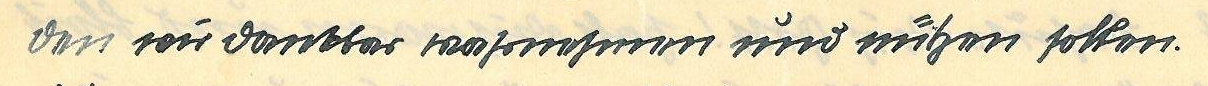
den wir dankbar wahrnehmen und nützen sollen.
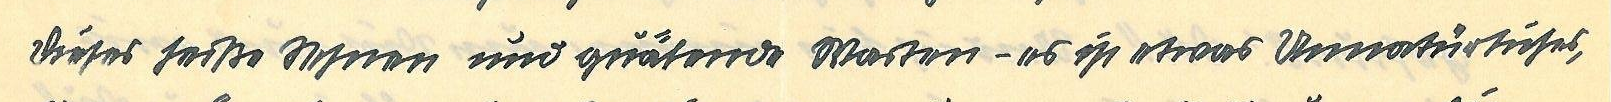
Dieses heiße Sehnen und quälende Warten – es ist etwas Unnatürliches,
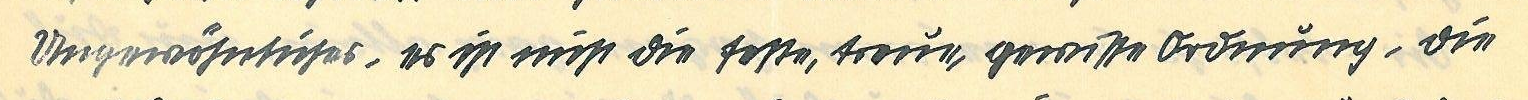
Ungewöhnliches, es ist nicht die feste, treue gewisse Ordnung, die
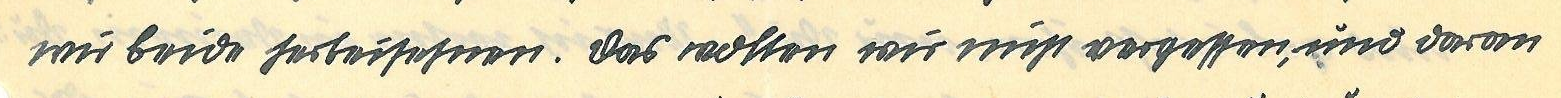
wir beide herbeisehnen. Das wollen wir nicht vergessen, und daran
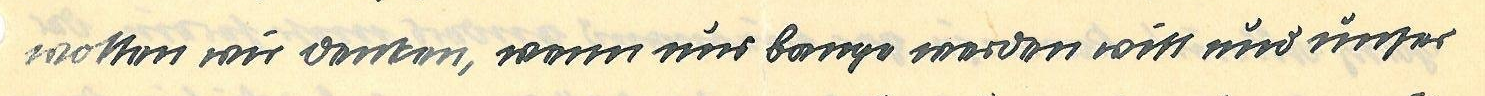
wollen wir denken, wenn uns bange werden will und unser
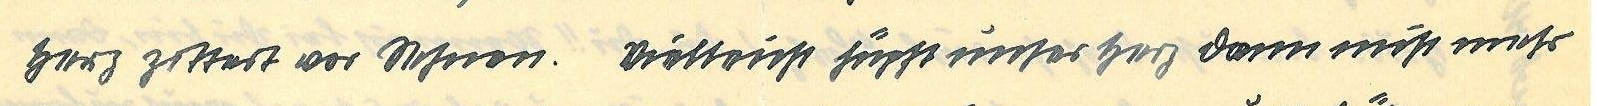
Herz zittert vor Sehnen. Vielleicht hüpft unser Herz dann nicht mehr
